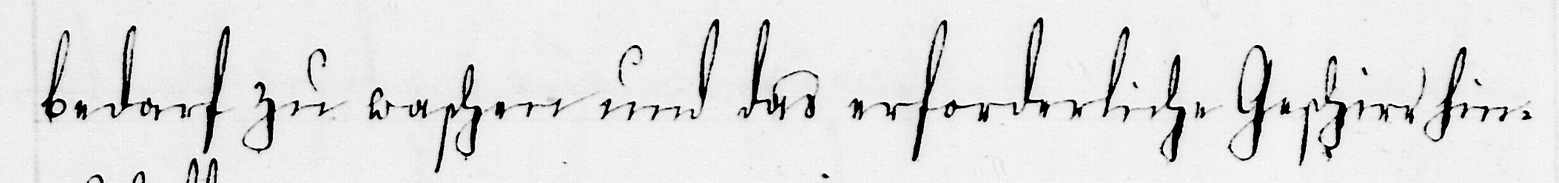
bedarf zu waschen und das erforderliche Geschirr hi¬
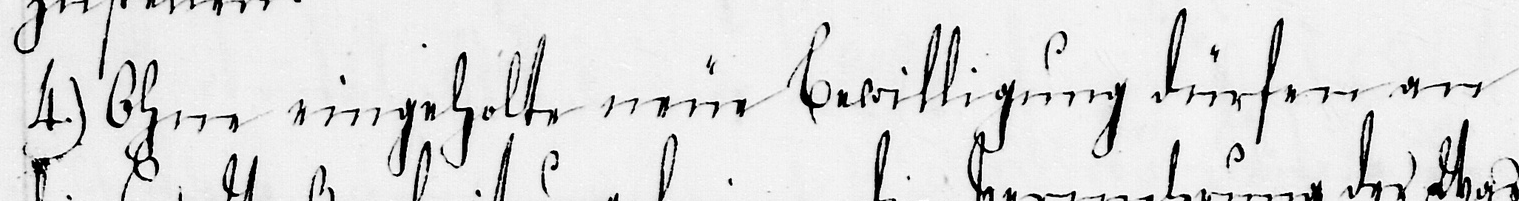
4.) Ohne eingeholte neue Bewilligung dürfen an
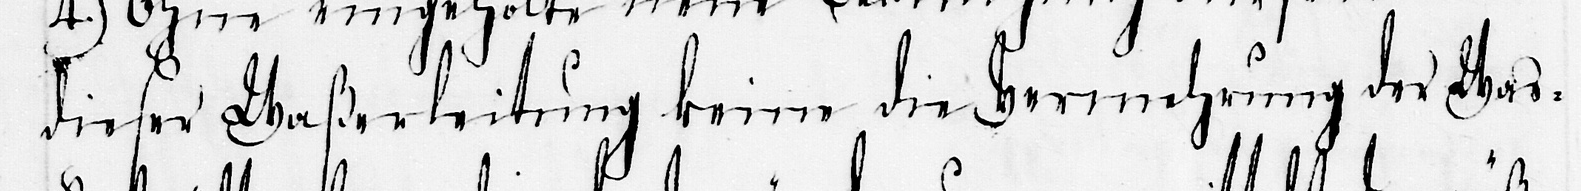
dieser Waßerleitung keine die Vermehrung der Wa¬
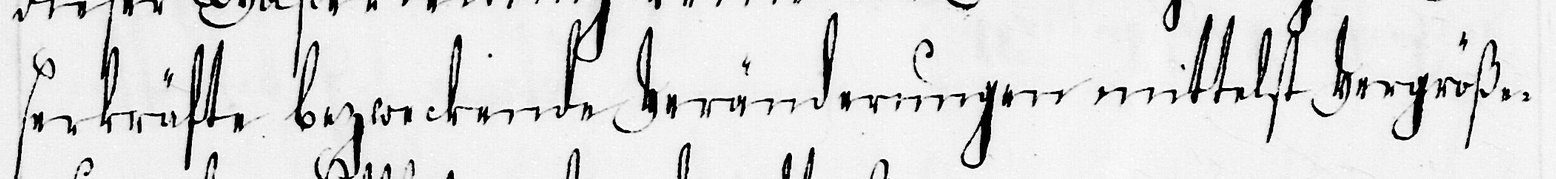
ßerkräfte bezweckende Veränderungen mittelst Vergröße¬
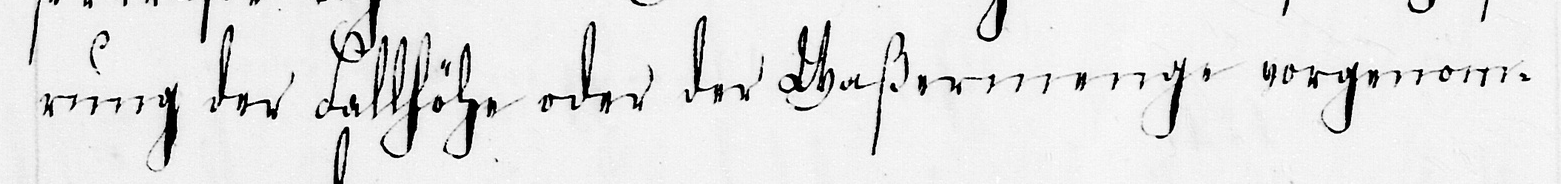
rung der Fallhöhe oder der Waßermenge vorgenom¬
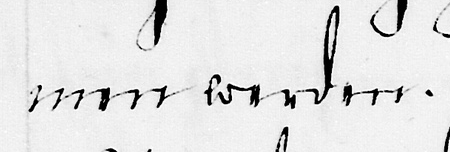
men werden.
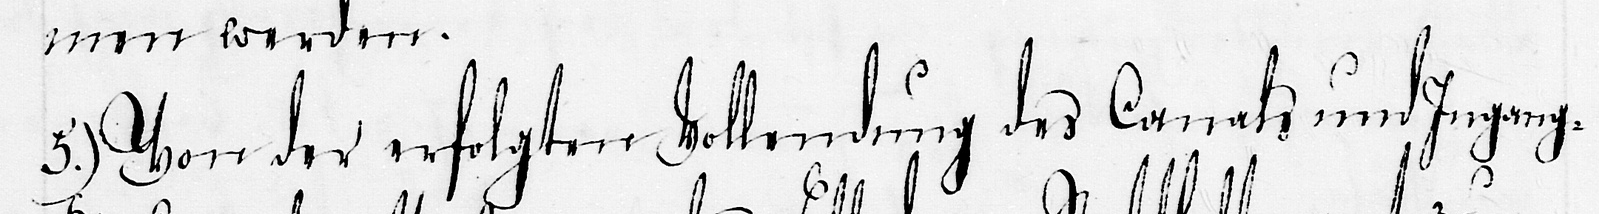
5.) Von der erfolgten Vollendung des Canals und Ingang¬
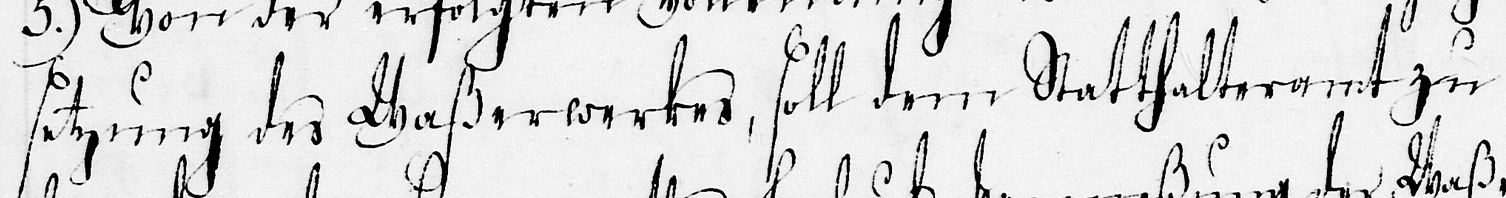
setzung des Waßerwerkes, soll dem Statthalteramt zu
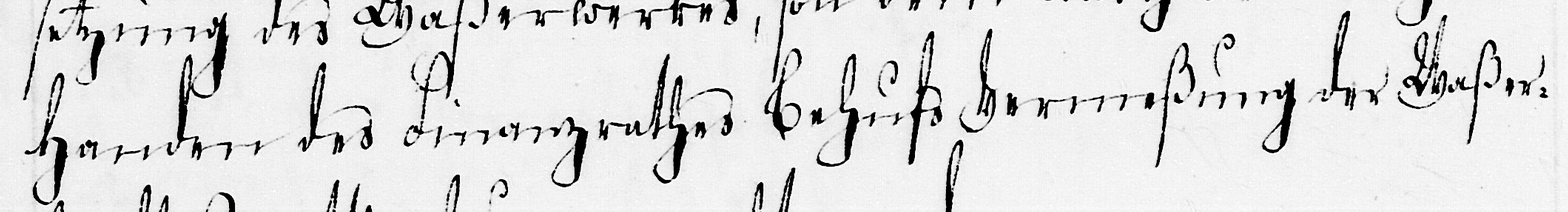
Handen des Finanzrathes Behufs Vermeßung der Waße¬
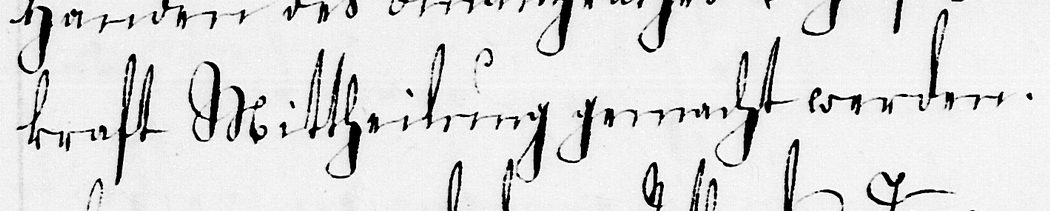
rkraft Mittheilung gemacht werden.
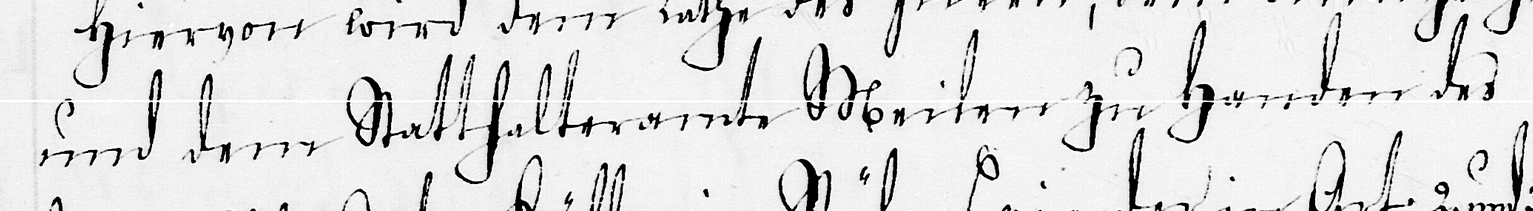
und dem Statthalteramte Meilen zu Handen des
